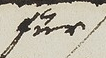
ger
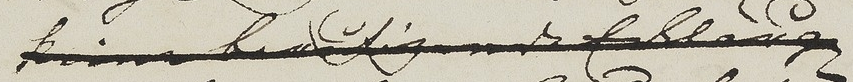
keine beruhigende Erklärungen
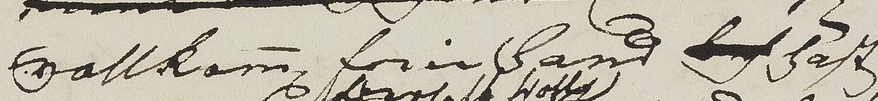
vollkommen freie Hand beh hast,
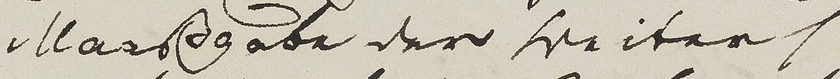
Maaßgabe der weiter s.
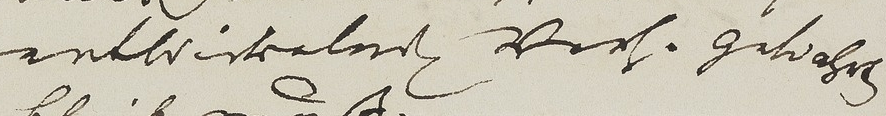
entwickelnden Verh. gewahrt
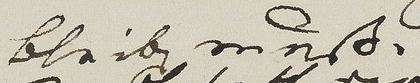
bleiben muß.
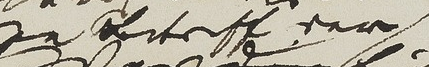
In Betreff der
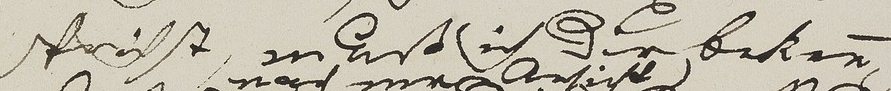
sprichst, muß ich Dir bekennen,
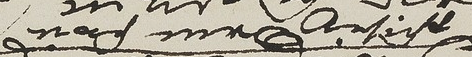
nach mr Ansicht
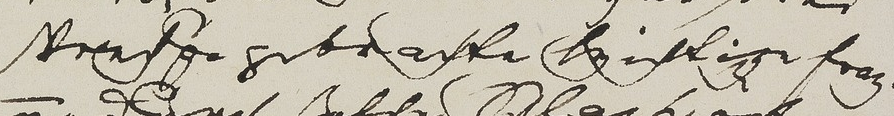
sprechg. gebrachte wichtige Frage
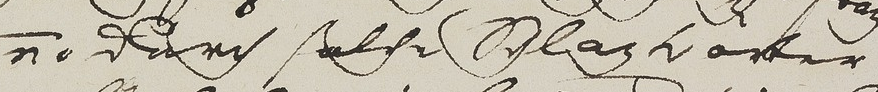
n. durch solche Schlagwörter
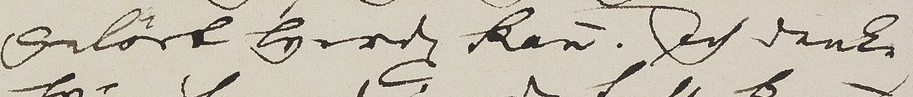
gelöst werden kann. Ich denke
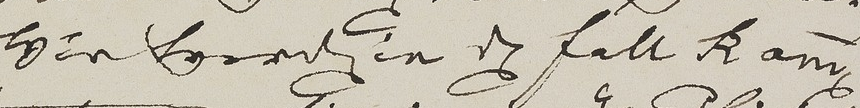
wir werden in den Fall kommen,
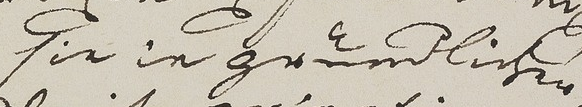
sie in gründlicherer
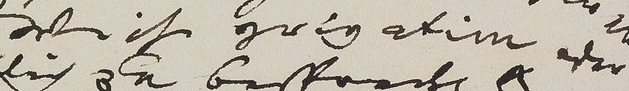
Weise privatim oder
